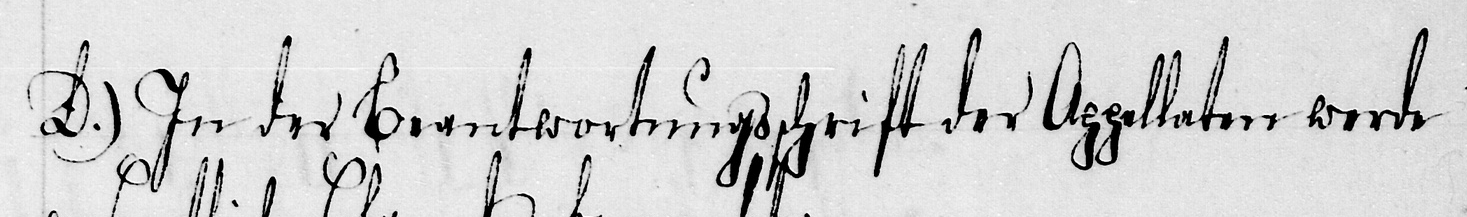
D.) In der Beantwortungsschrift der Appellaten werde
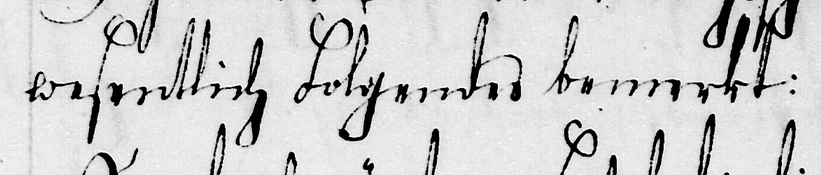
wesentlich Folgendes bemerkt:
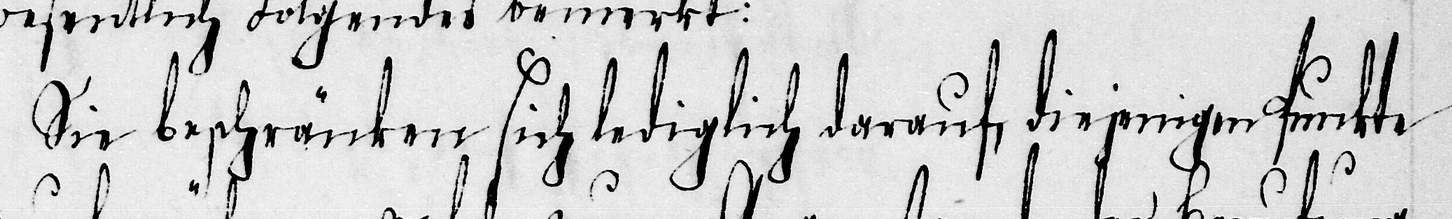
Sie beschränken sich lediglich darauf, diejenigen
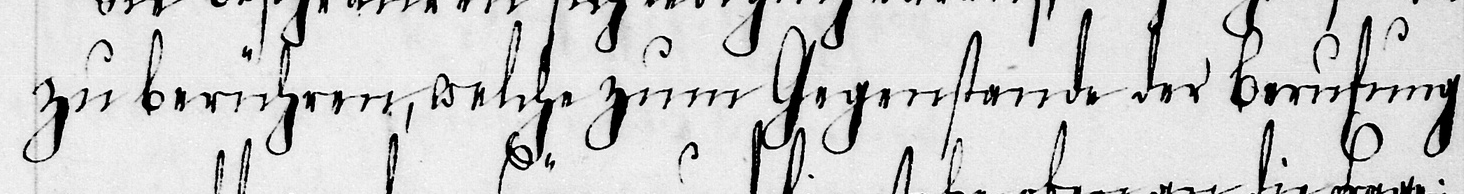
zu berühren, welche zum Gegenstande der Berufung
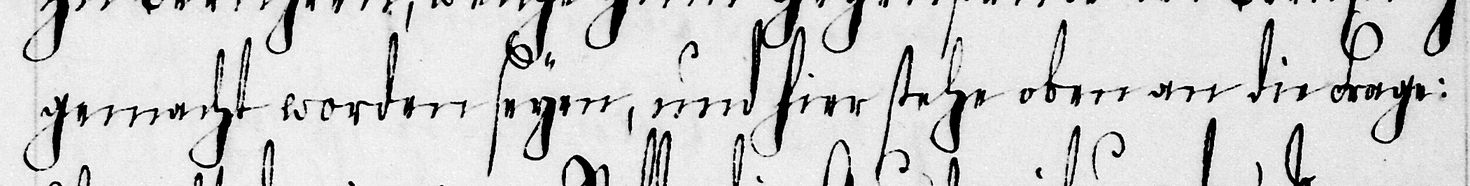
gemacht worden seyen, und hier stehe oben an die Frage:
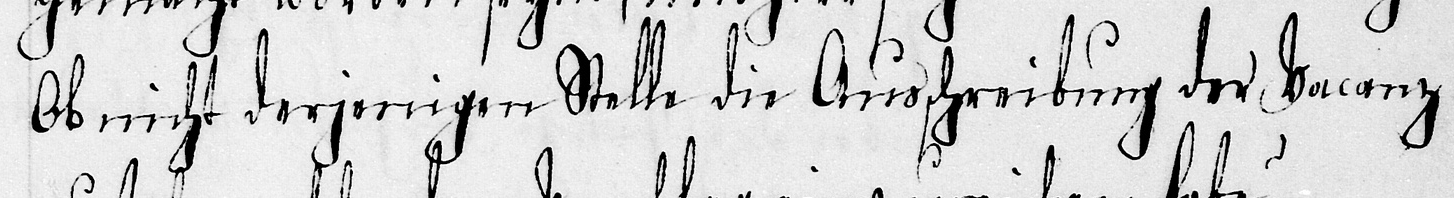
Ob nicht derjenigen Stelle die Ausschreibung der Vacanz
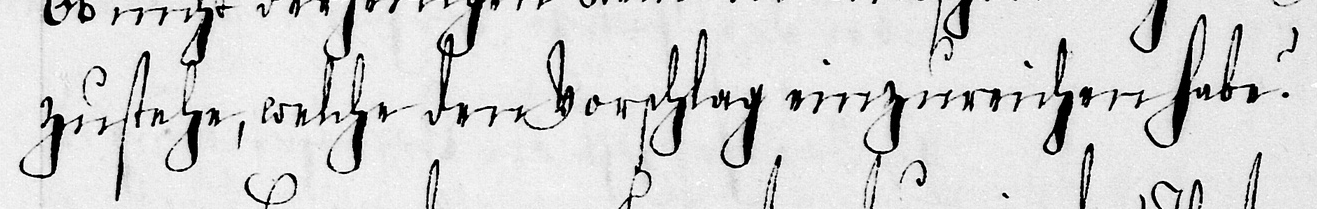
zustehe, welche den Vorschlag einzureichen habe?
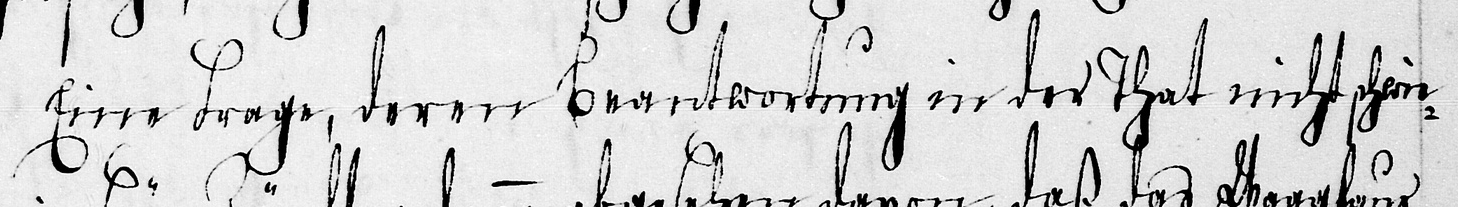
Eine Frage, deren Beantwortung in der That nicht schwi¬
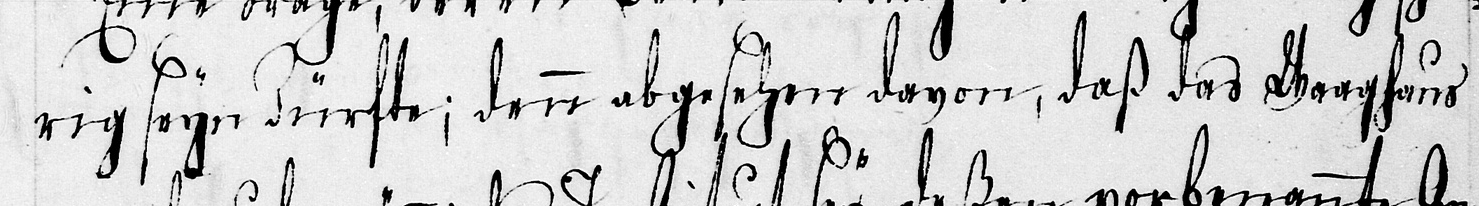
erig seyn dürfte; denn abgesehen davon, daß das Waaghaus
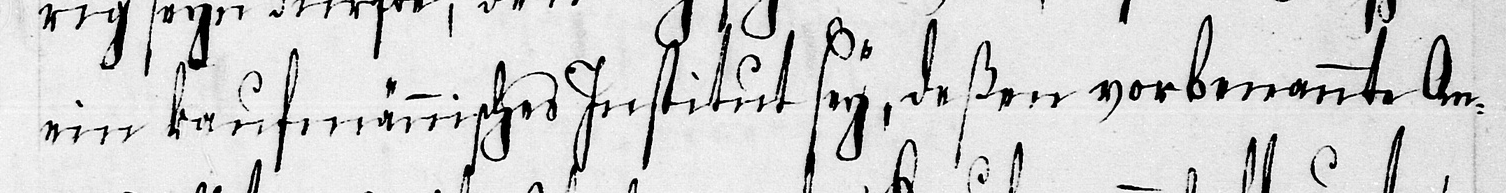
ein kaufmännisches Institut sey, deßen vorgenannte An¬
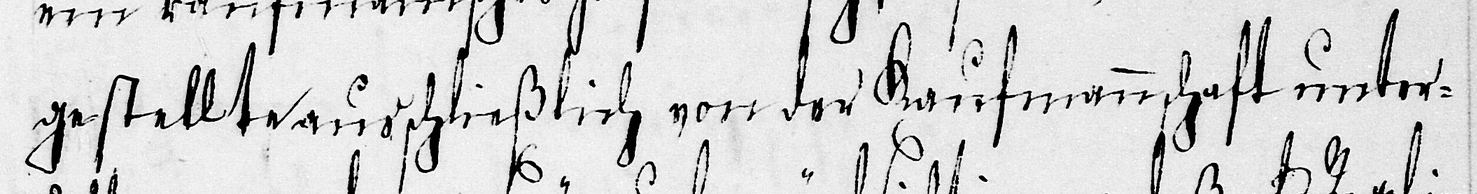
gestellte ausschließlich von der Kaufmannschaft unter¬
